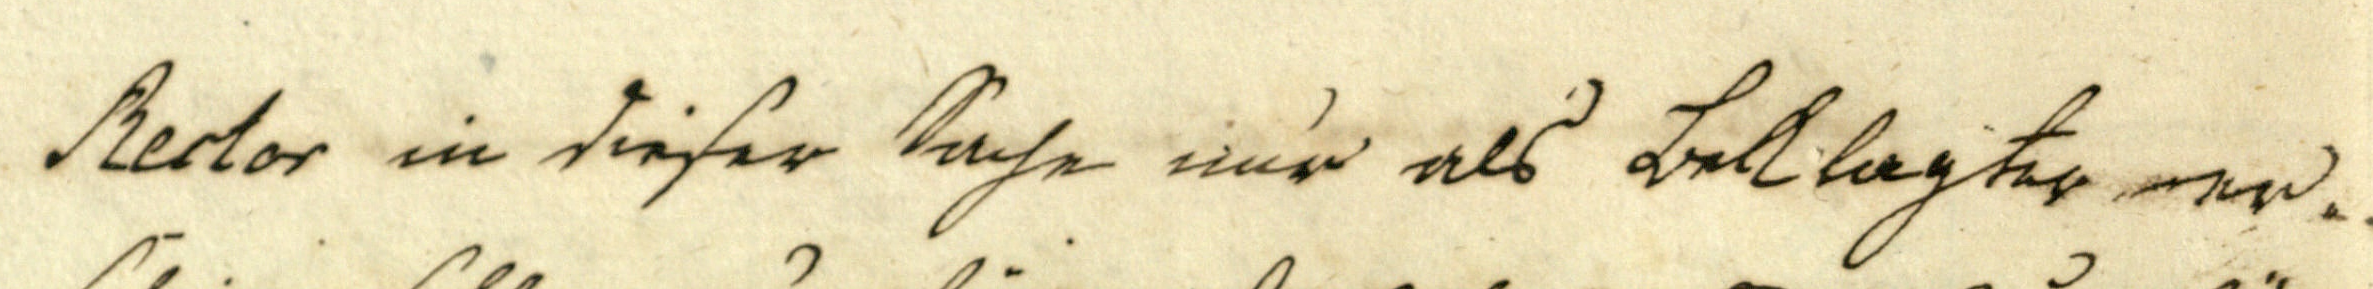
Rector in dieser Sache nur als Beklagter er¬
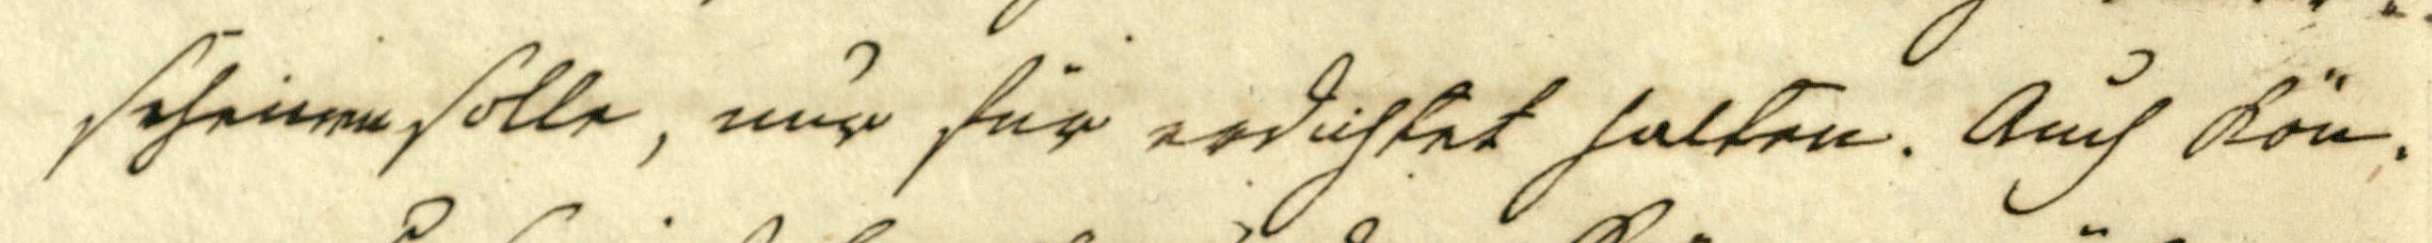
scheinen solle, nur für erdichtet halten. Auch kön¬
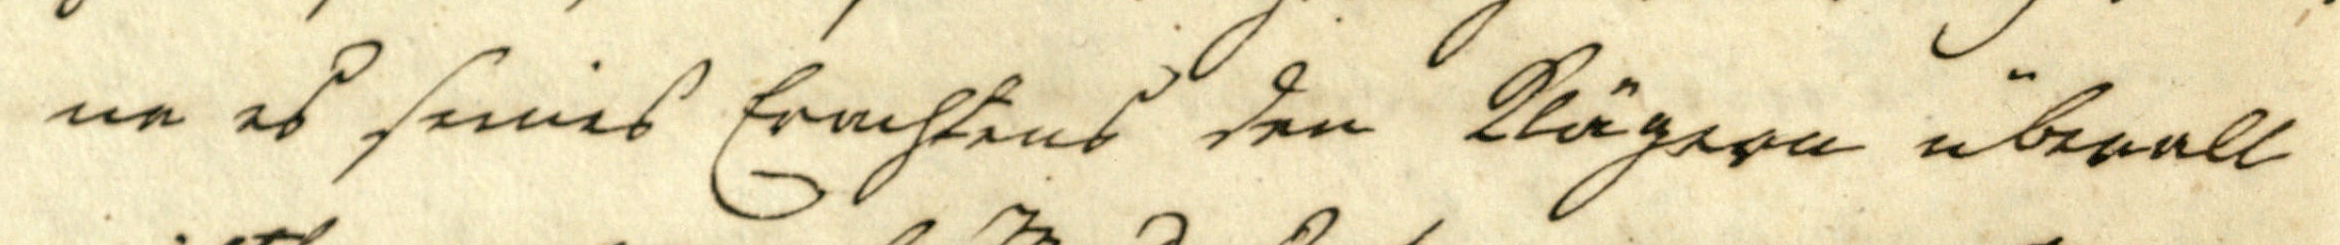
ne es seines Erachtens den Klägern überall
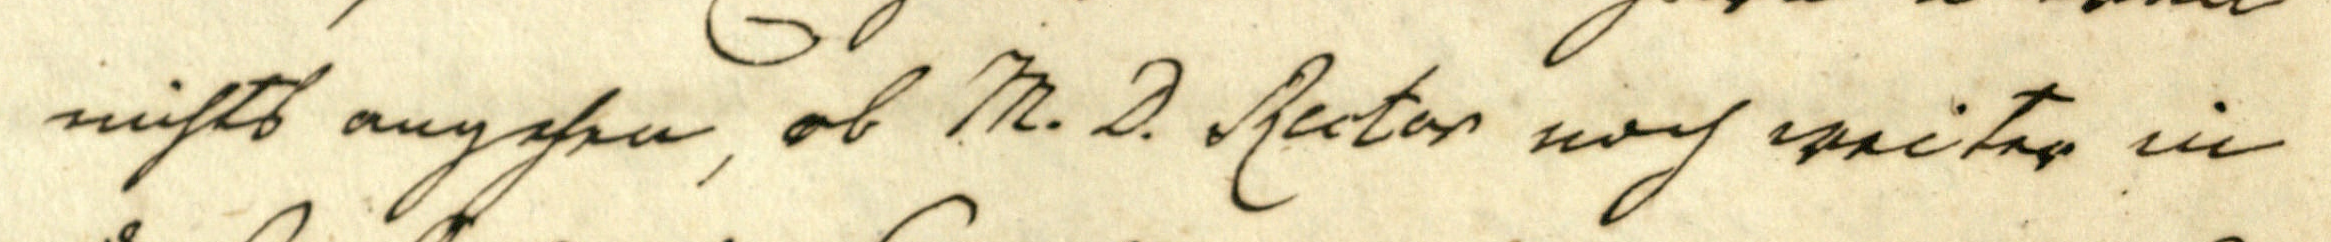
nichts angehen, ob M. D. Rector noch weiter in
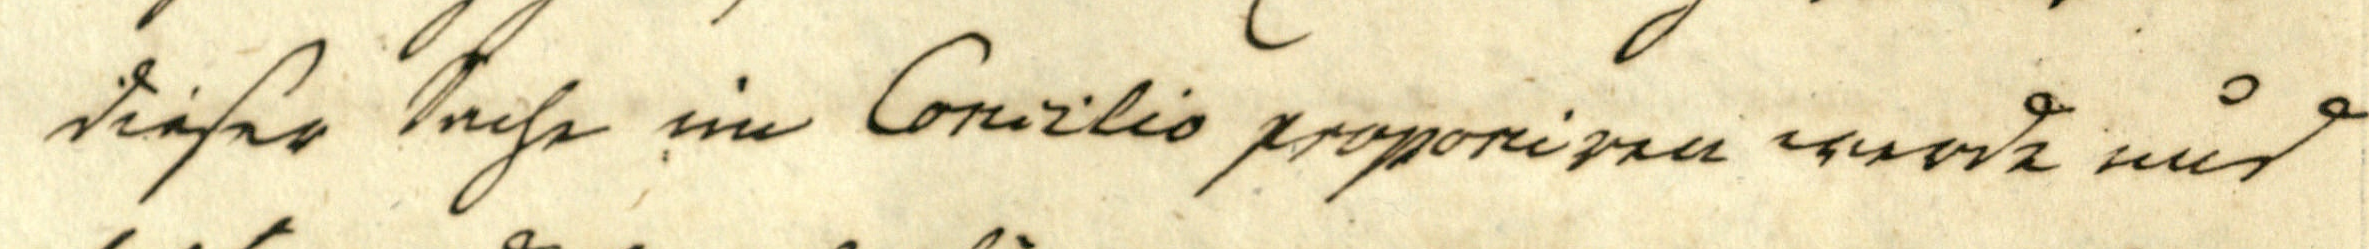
dieser Sache im Concilio proponiren werde und
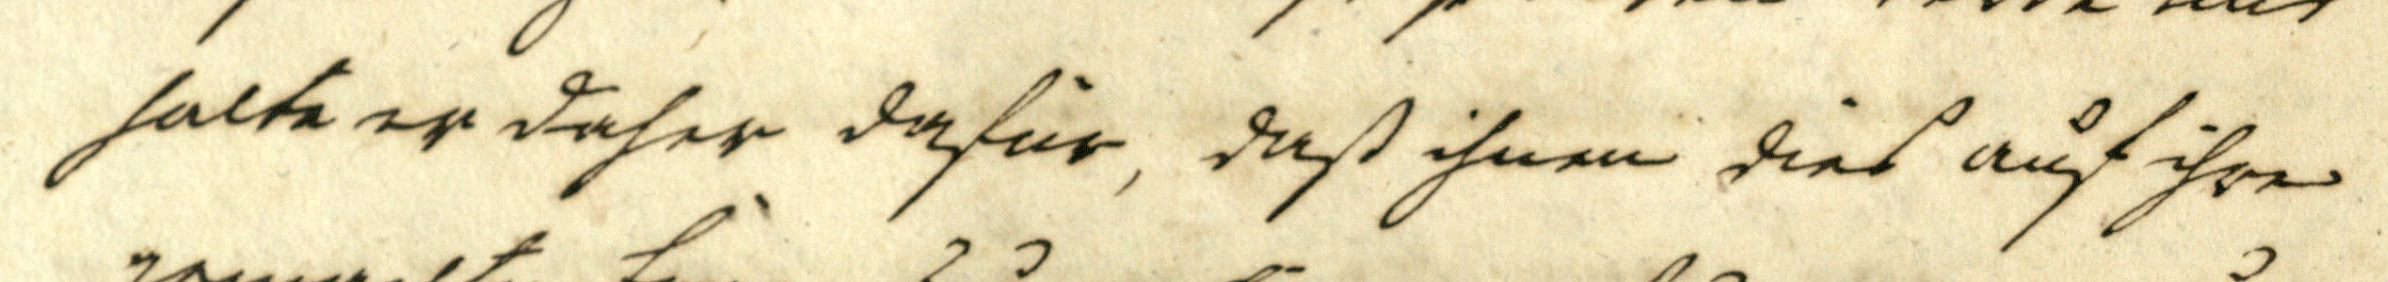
halte er daher dafür daß ihnen dies auf ihre
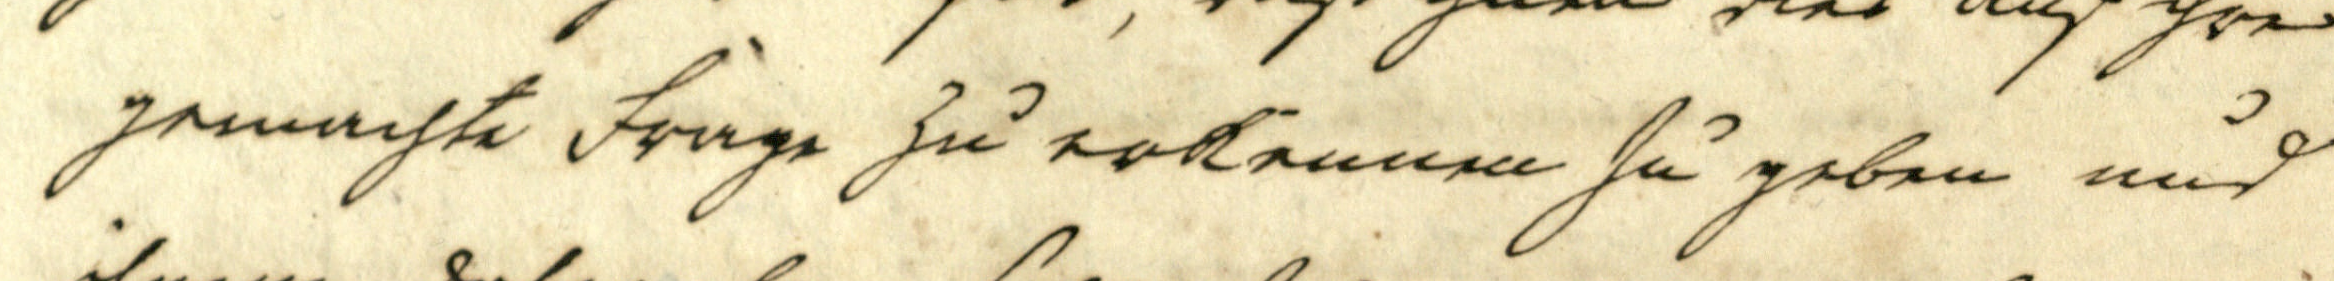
gemachte Frage zu erkennen zu geben und
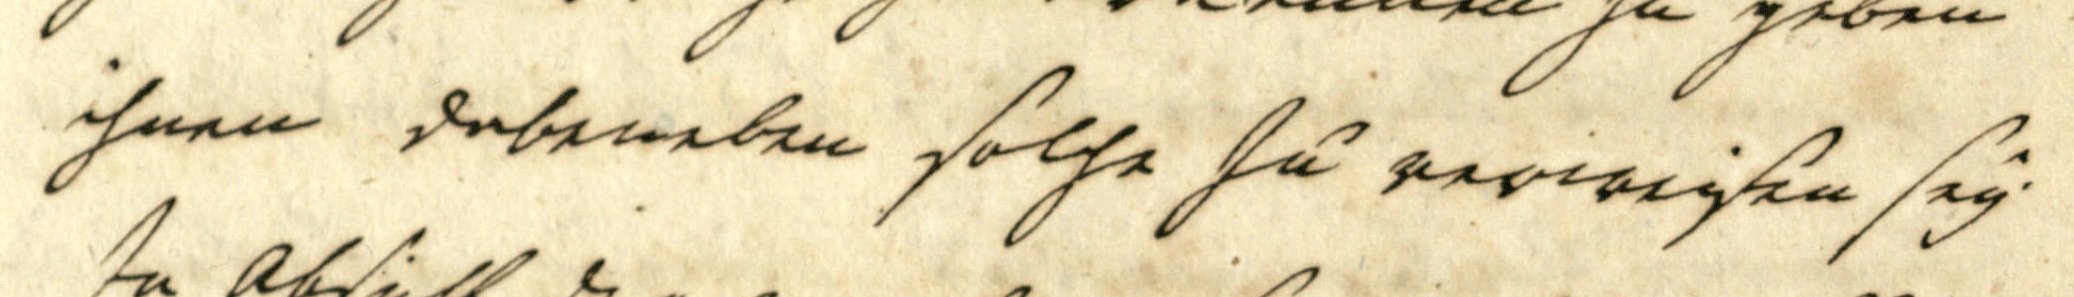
ihnen dabeneben solche zu verweisen seÿ.
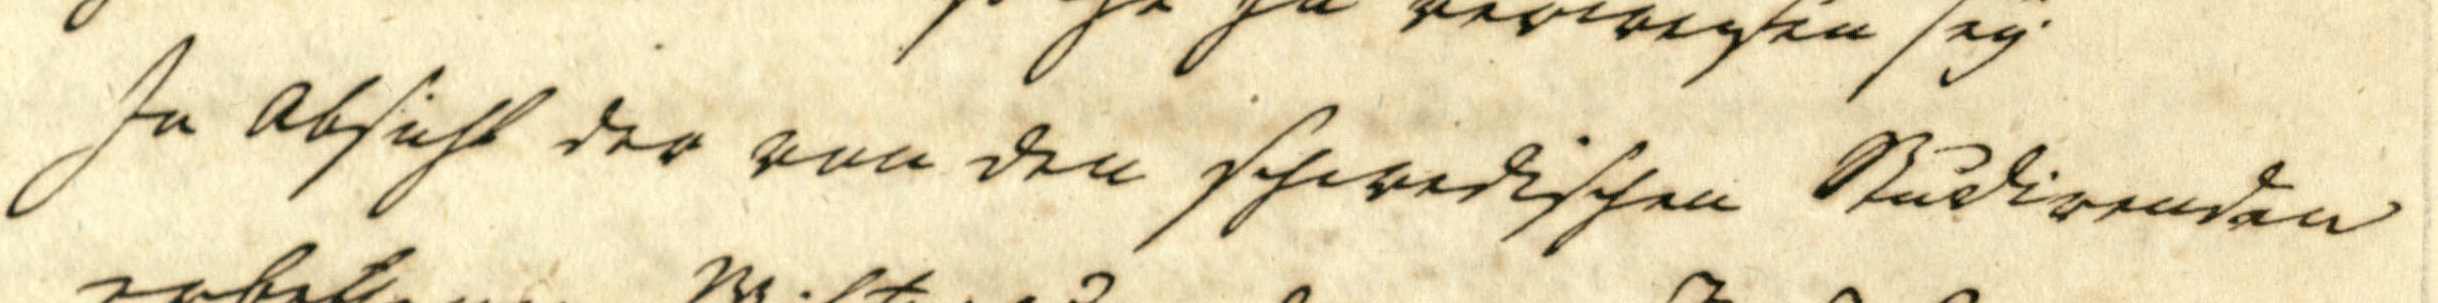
In Absicht der von den schwedischen Studirenden
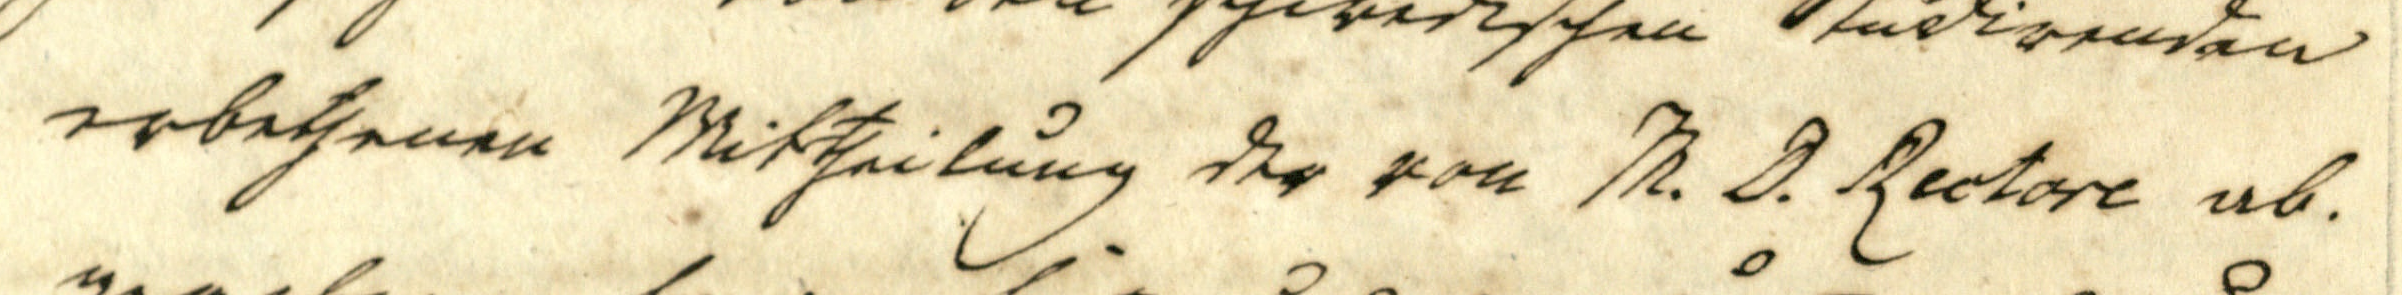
erbethenen Mittheilung der von M. D. Rectore ab¬
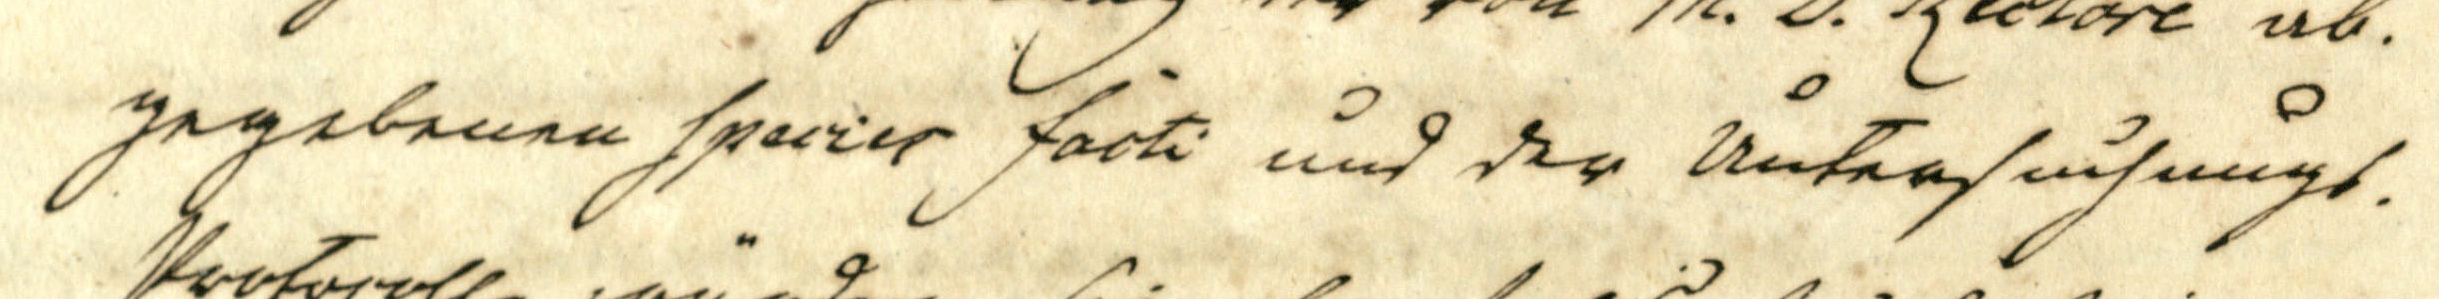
gegebenen species facti und der Untersuchungs¬
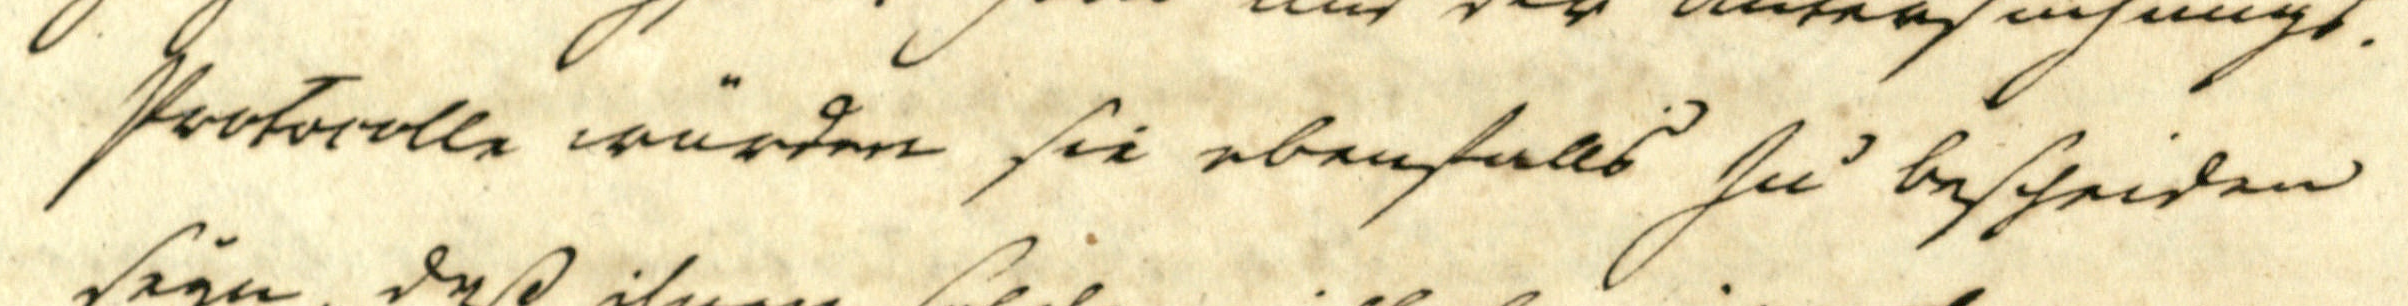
Protocolle würden sie ebenfalls zu bescheiden
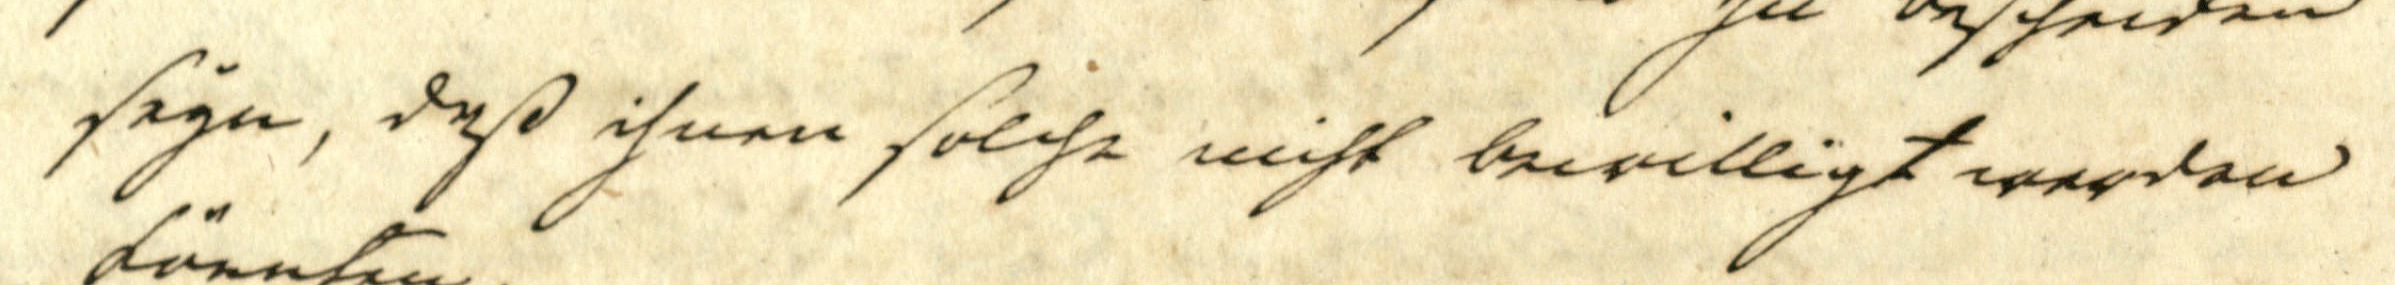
seÿn, daß ihnen solche nicht bewilligt werden
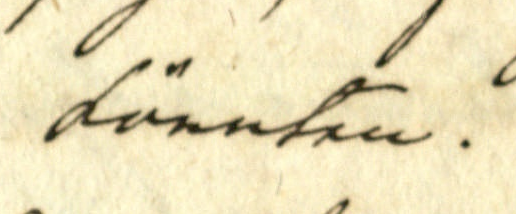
könnten.
